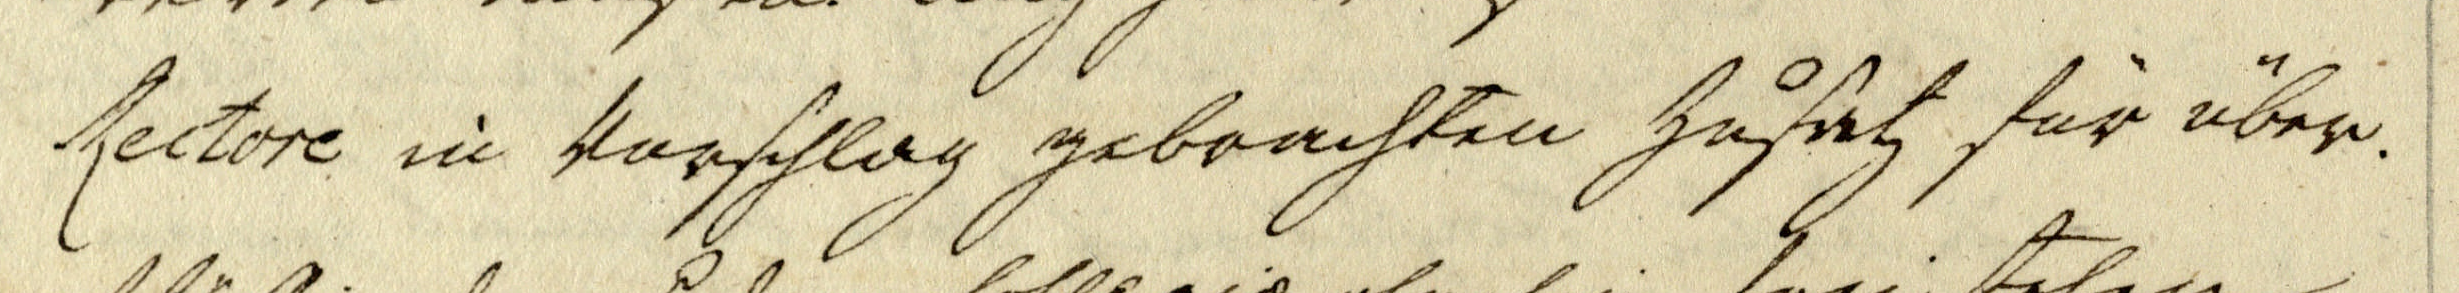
Rectore in Vorschlag gebrachten Zusatz für über¬
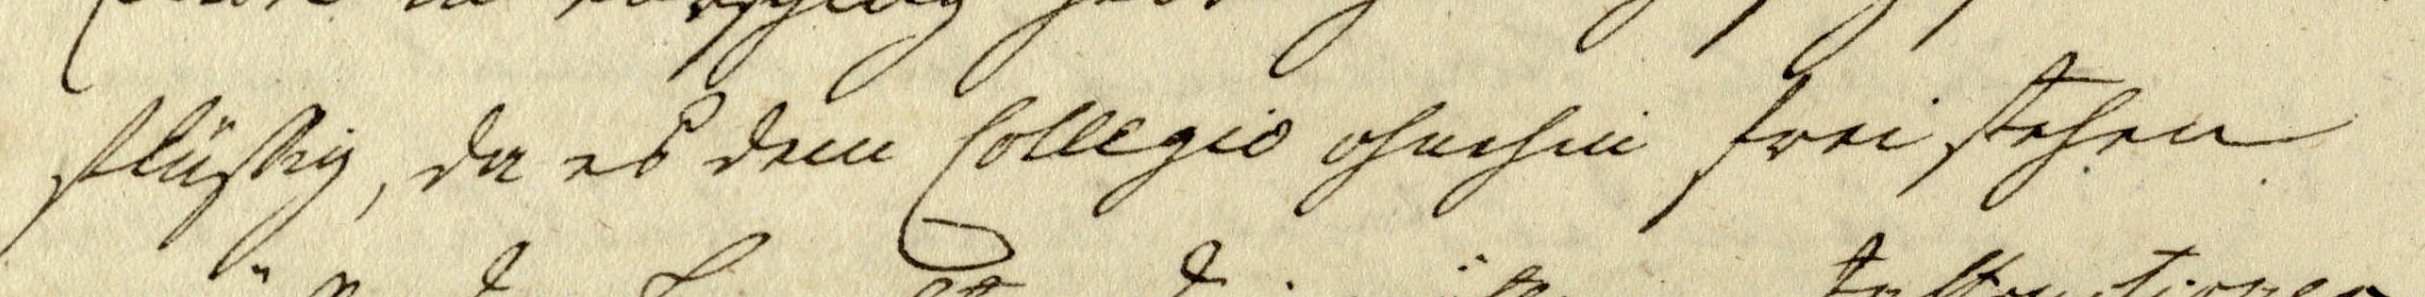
flüssig, da es dem Collegio ohnehin frei stehen
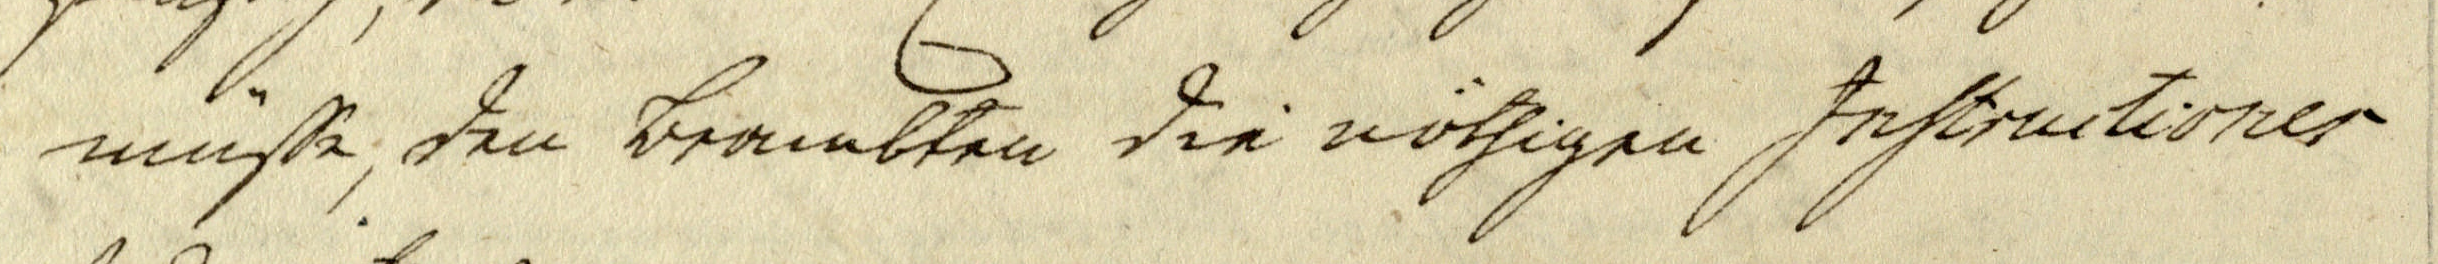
müsse, den Beambten die nöthigen Instructiones
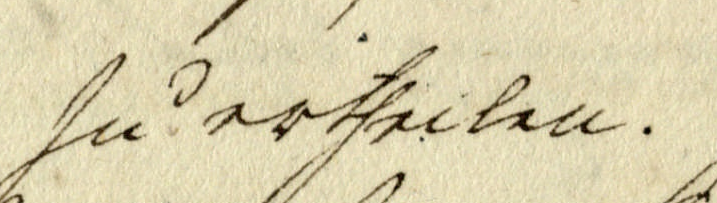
zu ertheilen.
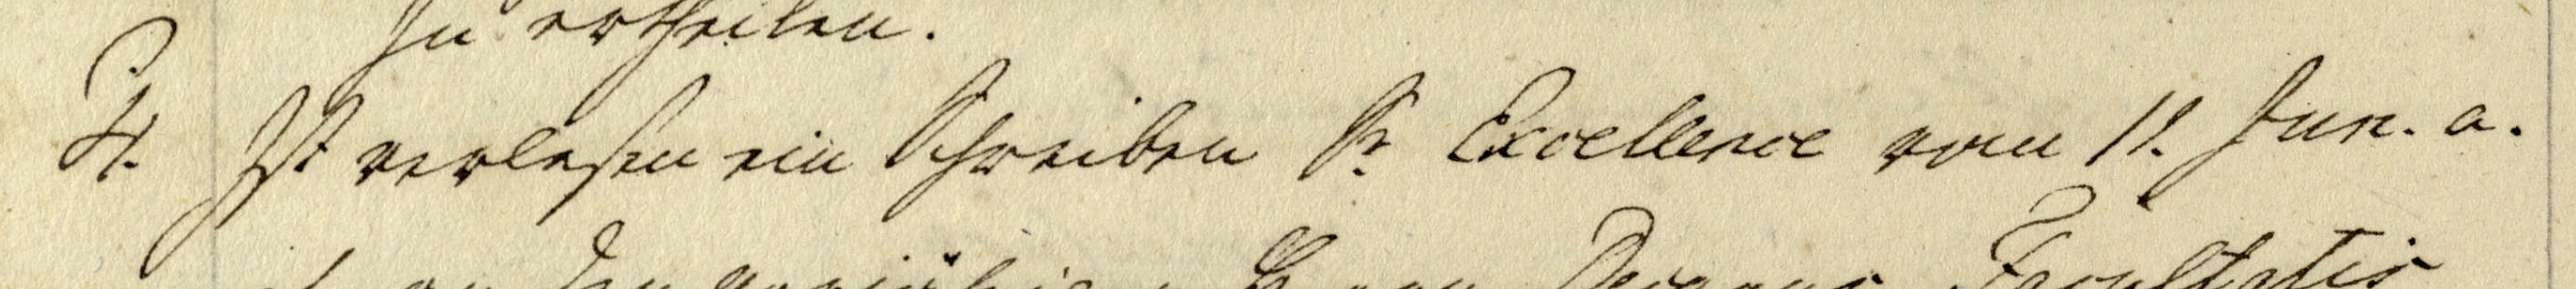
4. Ist verlesen ein Schreiben Sr Excellence vom 11. Jun. a.
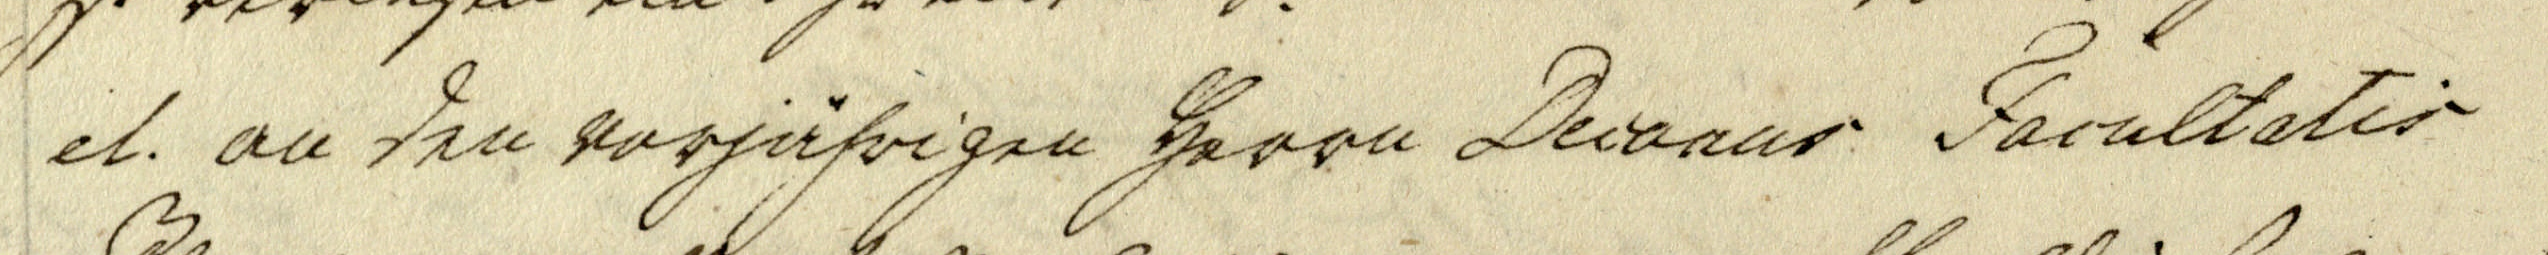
et. an den vorjährigen Herrn Decanus Facultatis
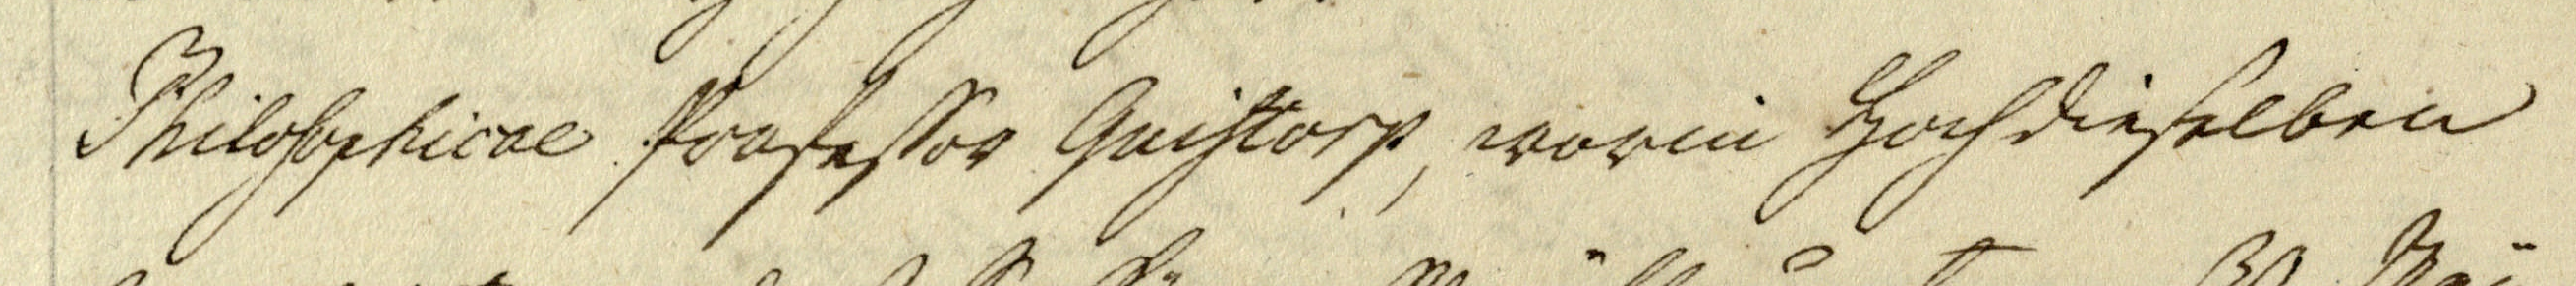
Philosophicae Professor Quistorp, worin Hochdieselben
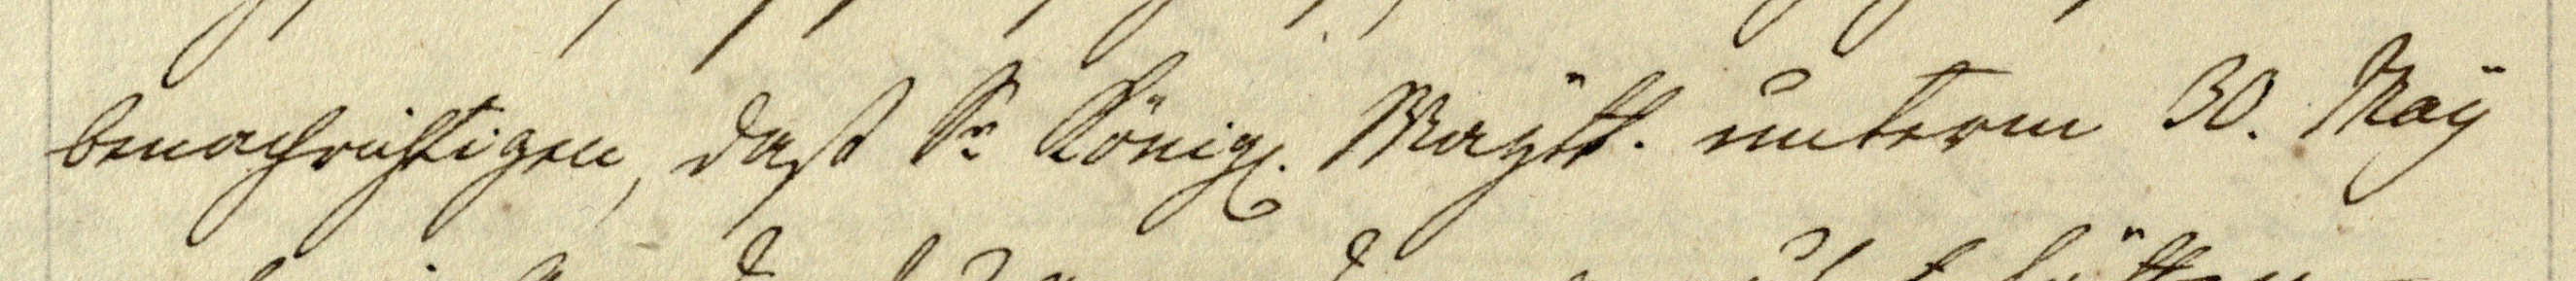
benachrichtigen, daß Sr Königl. Maÿtt. unterm 30. May
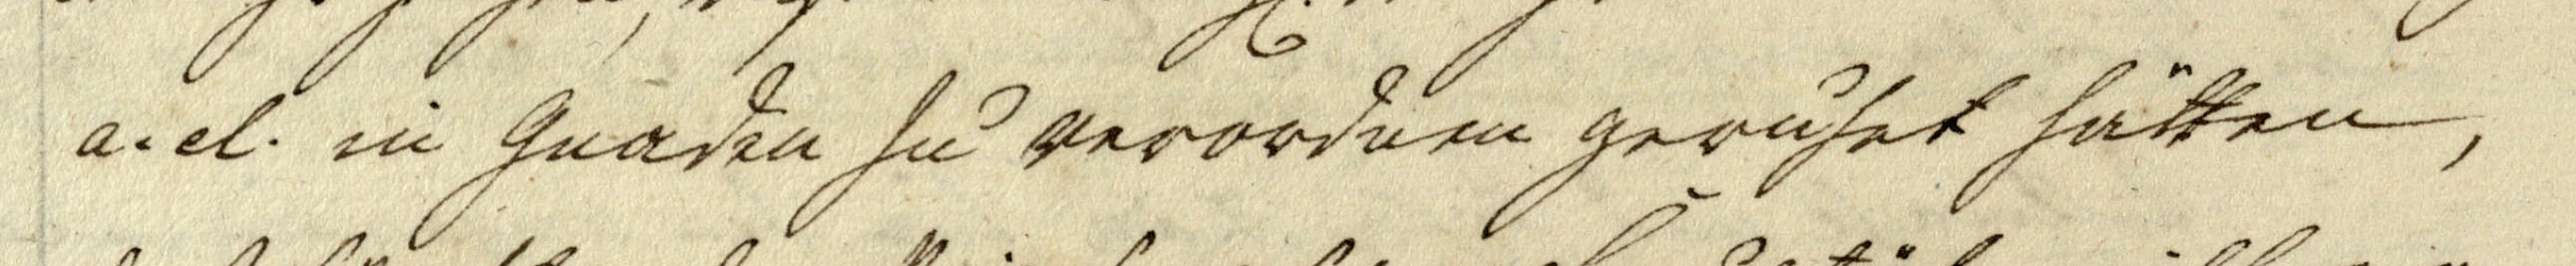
a. el. in Gnaden zu verordnen geruhet hätten,
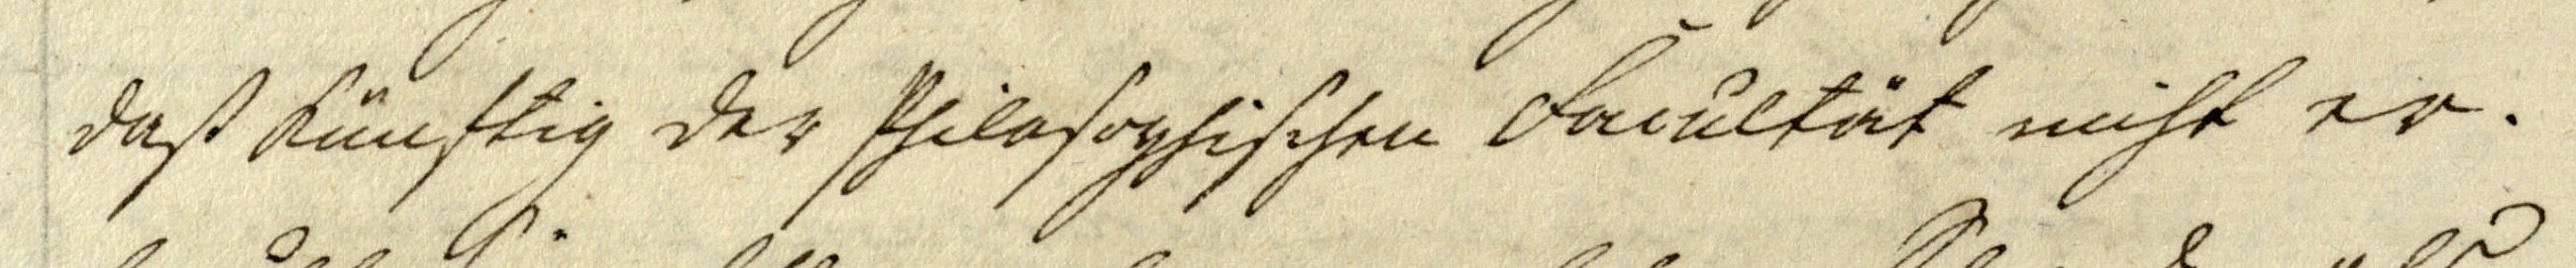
daß künftig der Philosophischen Facultät nicht er
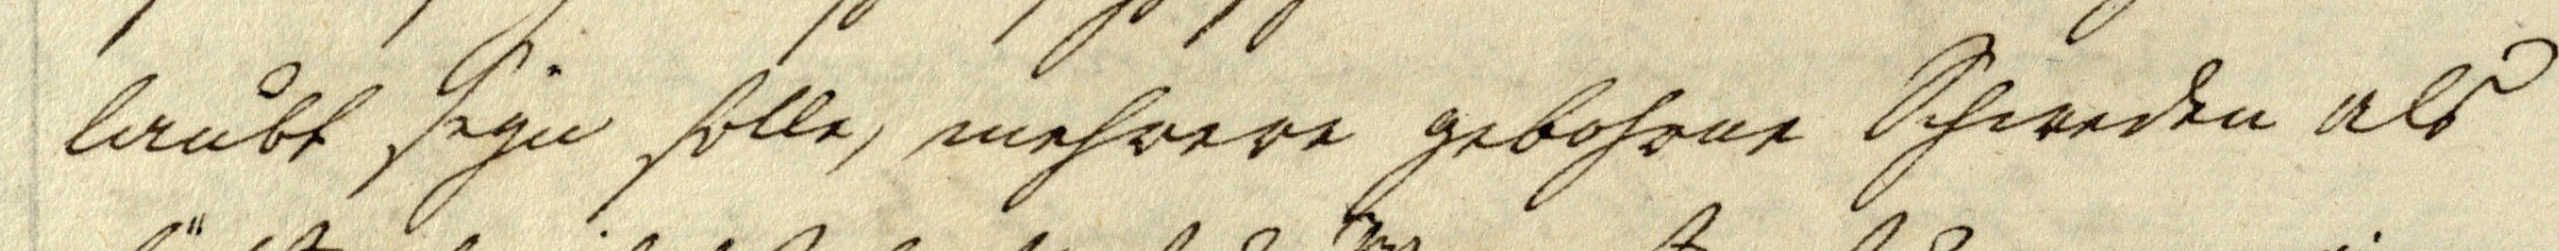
laubt seÿn solle, mehrere gebohrne Schweden als
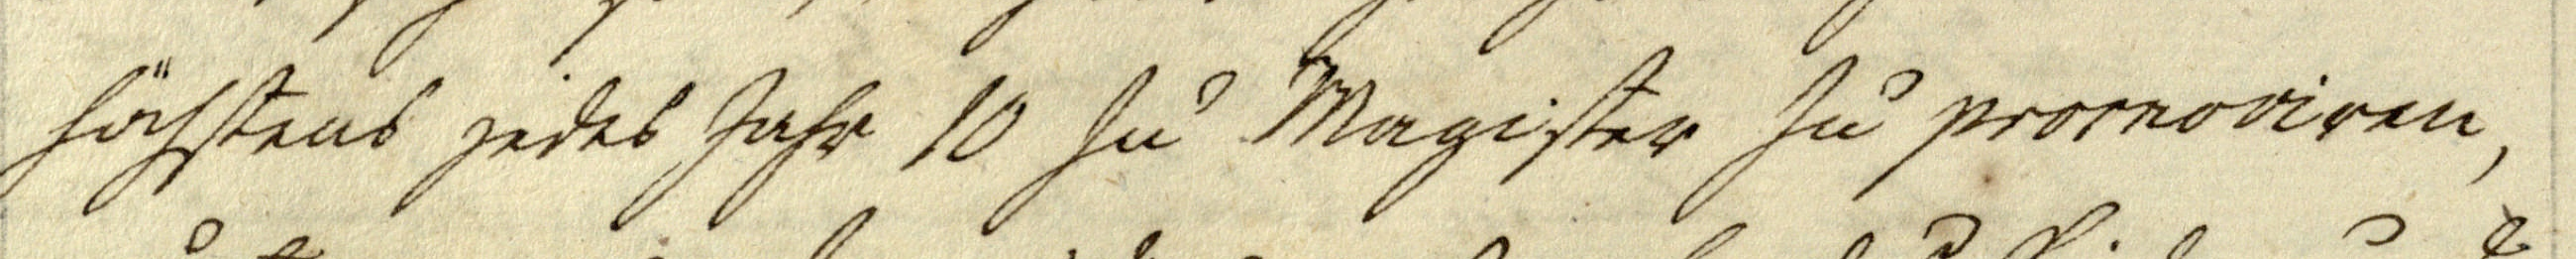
höchstens jedes Jahr 10 zu Magister zu promoviren,
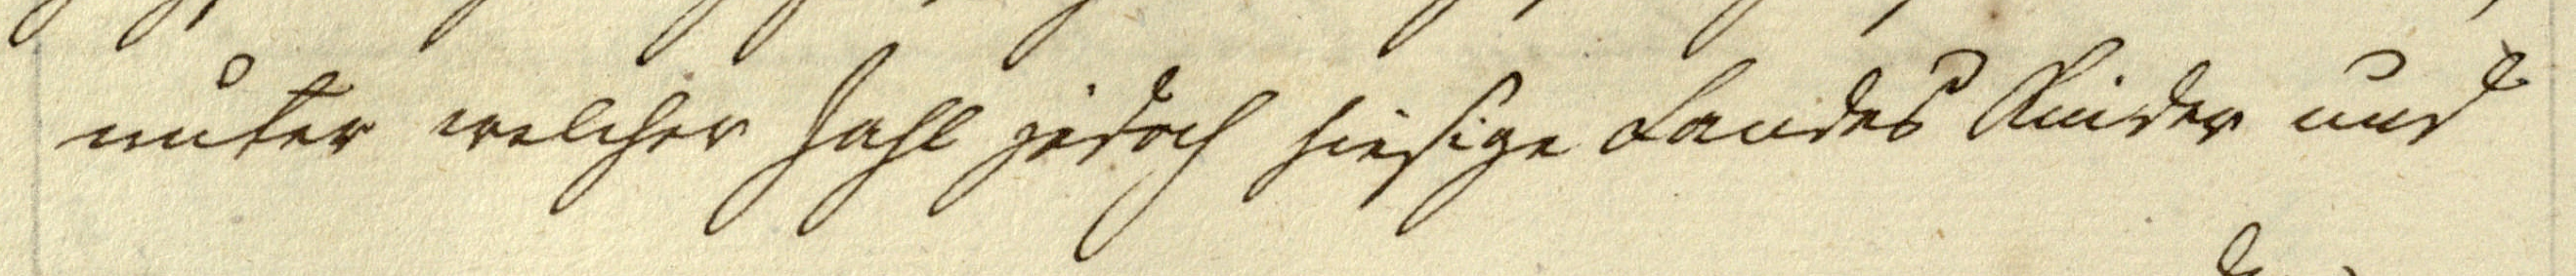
unter welcher Zahl jedoch hiesige Landes Kinder und
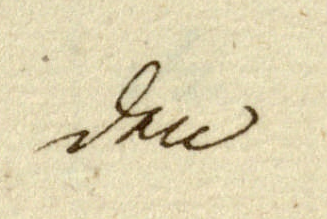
den
